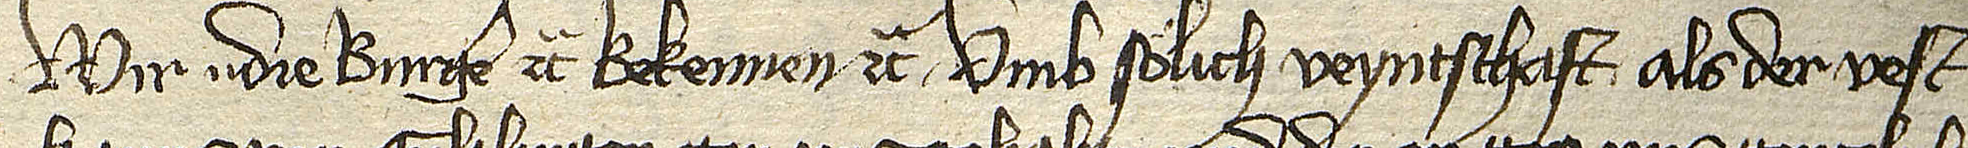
Wir ~ die Burge* ec* Bekennen ec* / Vmb ſölich veyntſchaft als der veſt
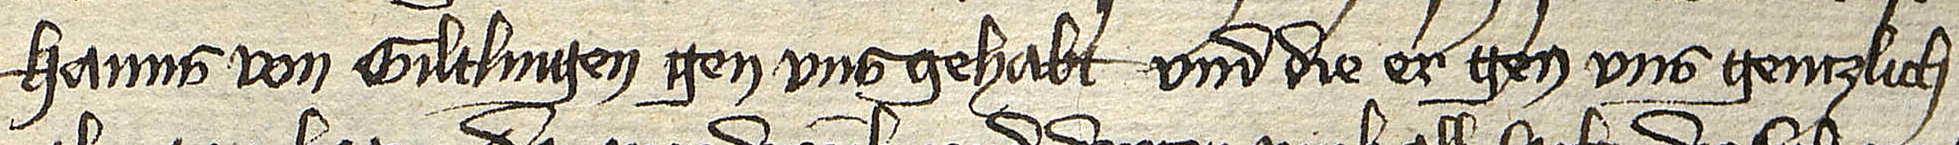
hanns von Giltlingen gen vns gehabt vnd die er gen vns gencʒlich
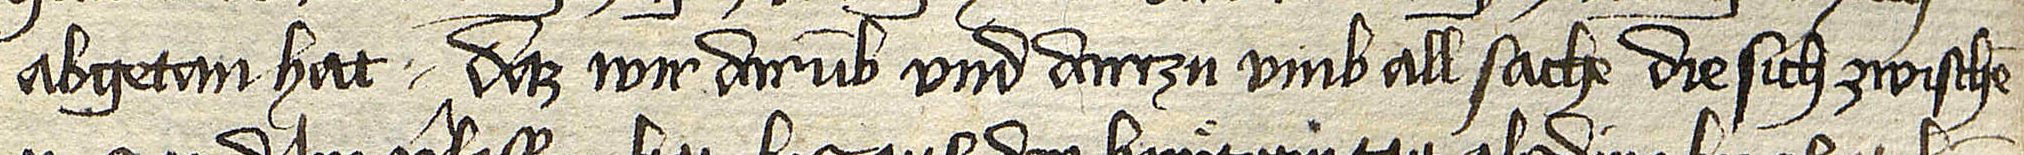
abgetan hat / Daʒ wir darub* vnd darcʒu vmb all ſache die ſich ʒwiſche*
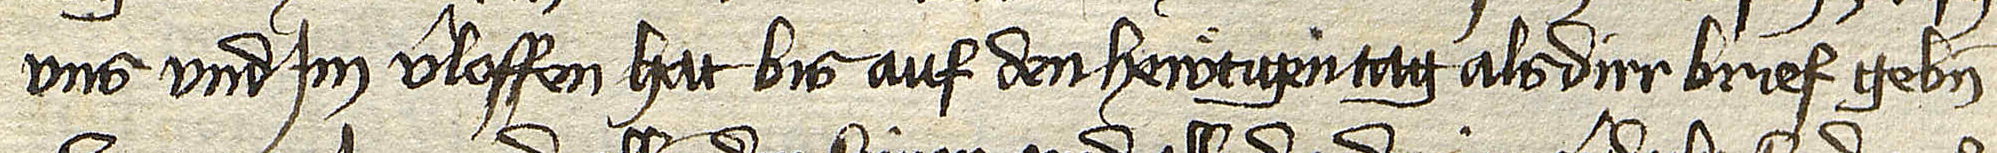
vns vnd Im v*loffen hat bis auf den heẅtigen tag als dirr brief gebn*
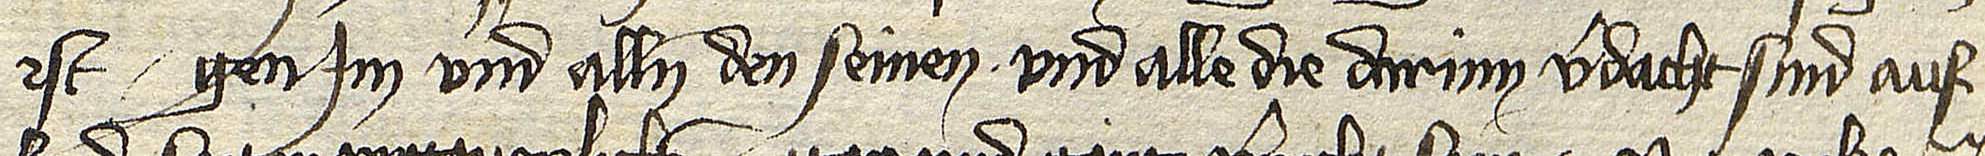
iſt / gen Im vnd alln* den ſeinen . vnd alle die darinn v*dacht ſind auf
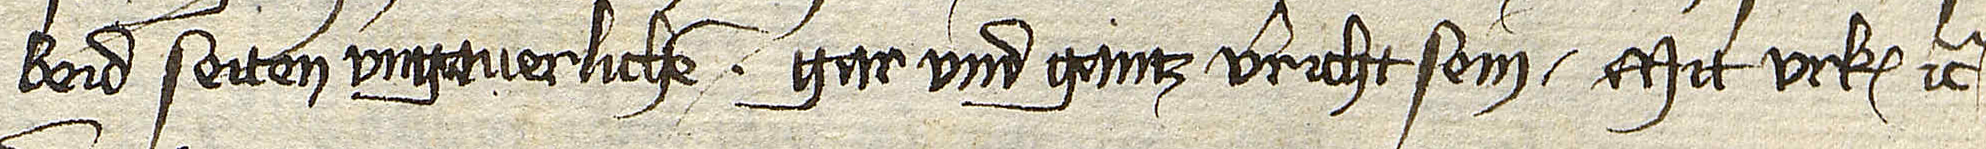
beid ſeiten vngeuerliche* . gar vns gancʒ v*richt ſein / Mit vrk* ec*
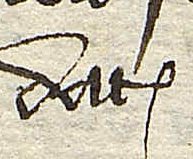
Dat*
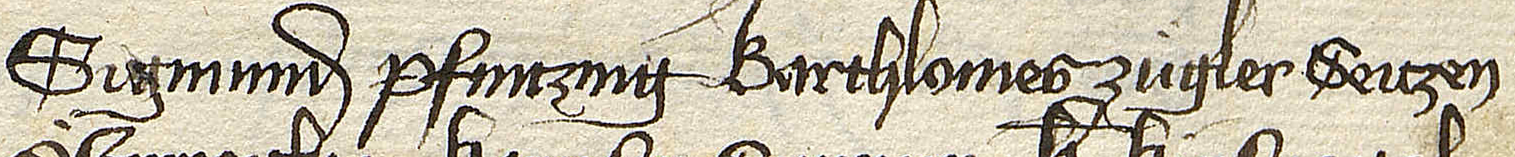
Sigmund* Pfincʒing Barthlomes ʒügler Seicʒen
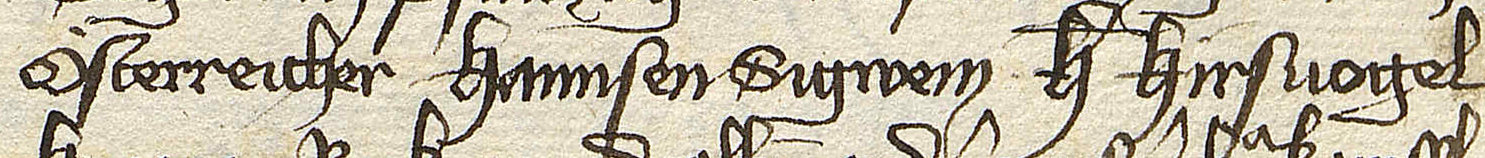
Öſterreicher Hannſen Sigwein H* Hirſuogel
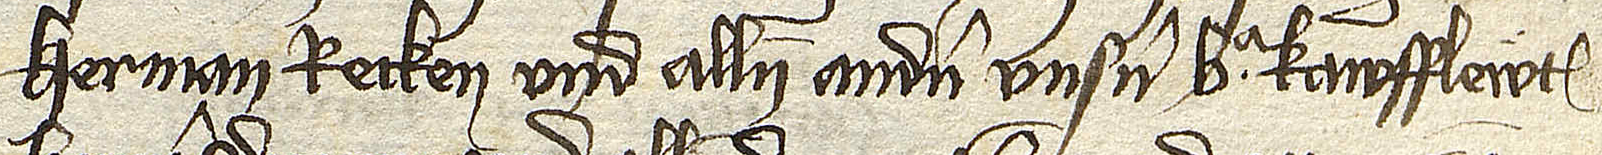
Herman Recken vnd alln* andn* vnſn* b* kawffleẅt*
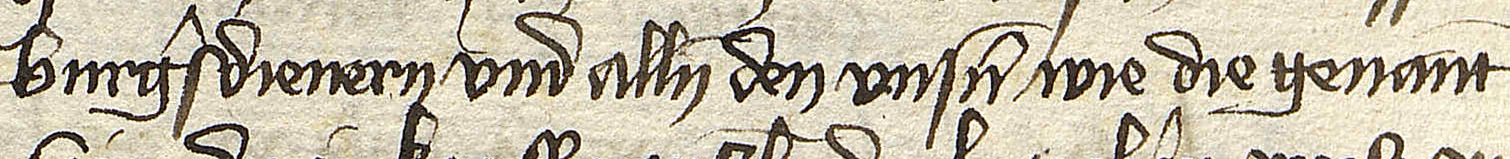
burg*ſdienern vnd alln* den vnſn* wie die genan*t
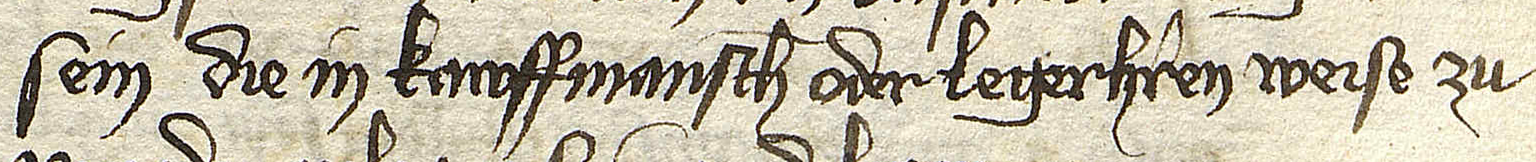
ſein die in kawffmanſch* oder legerh*ren weiſe ʒu
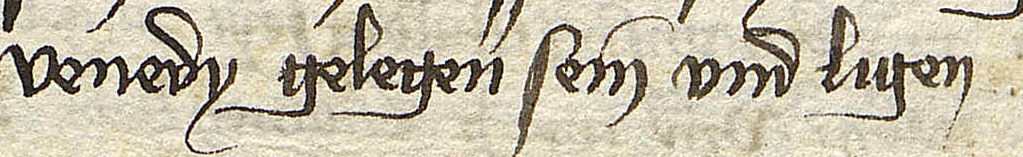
venedy gelegen ſein vnd ligen
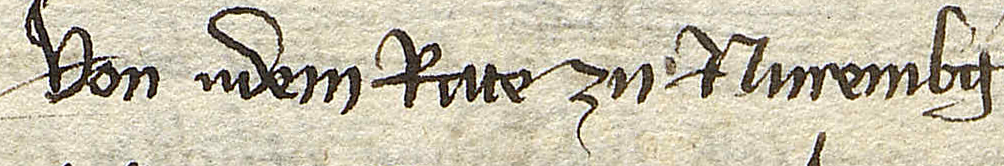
Von ~ dem Rate ʒu Nuremb*g
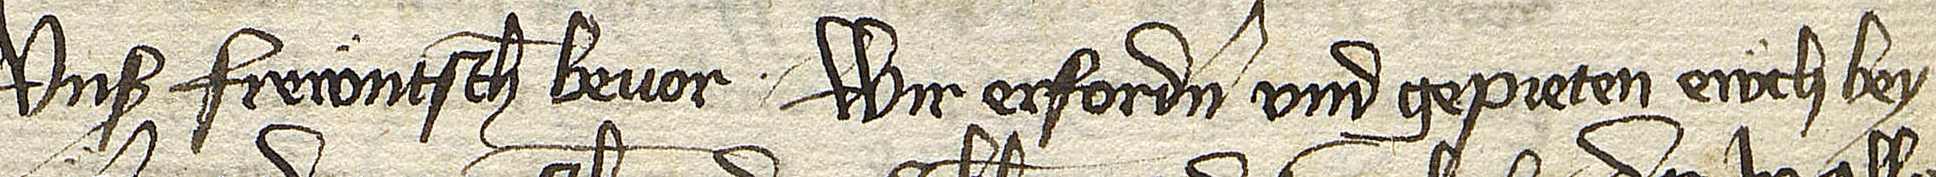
Vnſ* Freẅntſch* beuor . / Wie erfordn* vnd gepieten eẅch bey
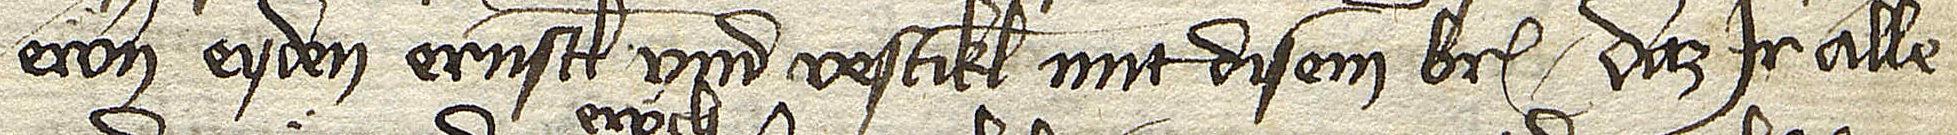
eẅ*n eyden ernſtl* vnd veſtikl* mit diſem br* / Daʒ Ir alle
